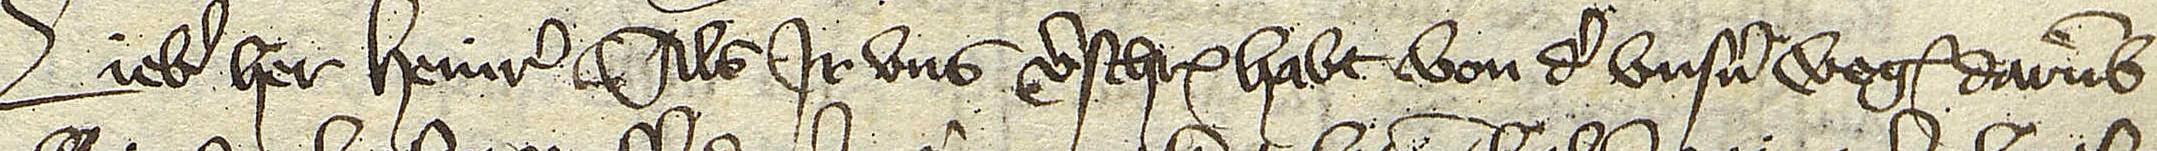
Lieb* her heinr* / Als Ir vns v*ſchr* habt / von d* vnſn* weg* darub*
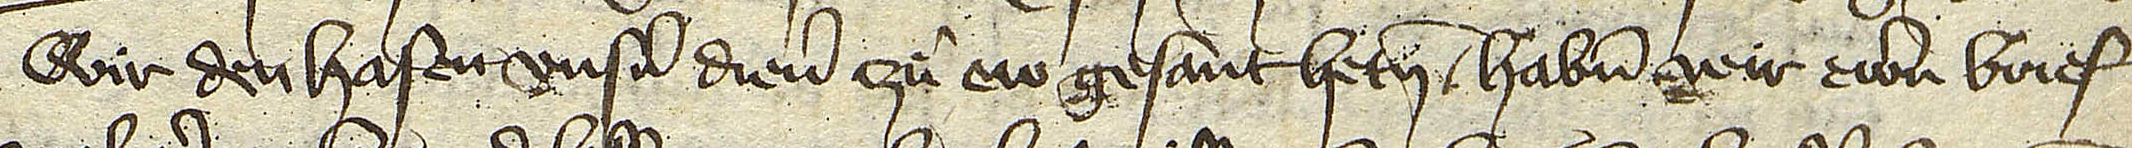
wir den hanſen vnſn* dien* cʒü ew geſant / habn* wir ew*n brief
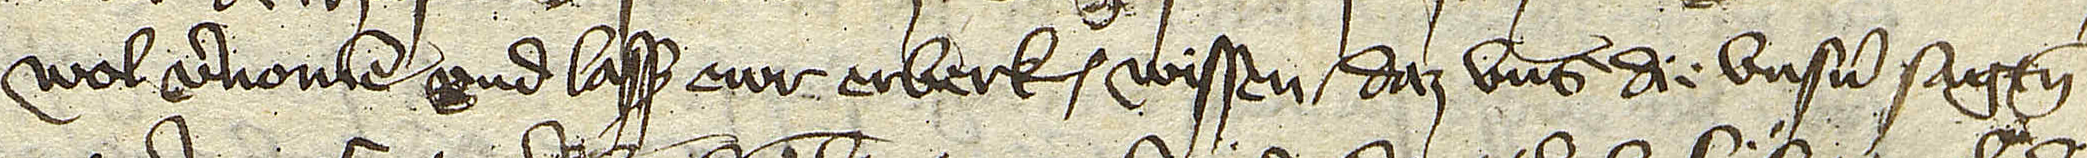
wol v*nome* vnd laſſ* ewr erberk* wiſſen / daʒ vns die vnſn* ſagtn*
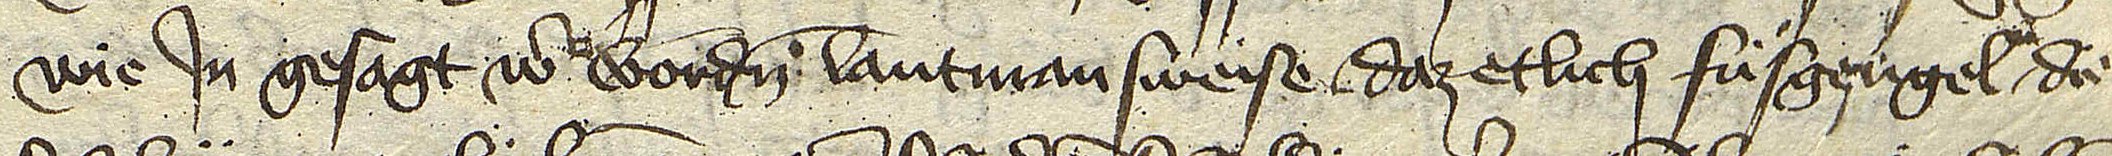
wie In geſagt w* wordn* lantmanſweiſe / daʒ etlich füſgengel / die
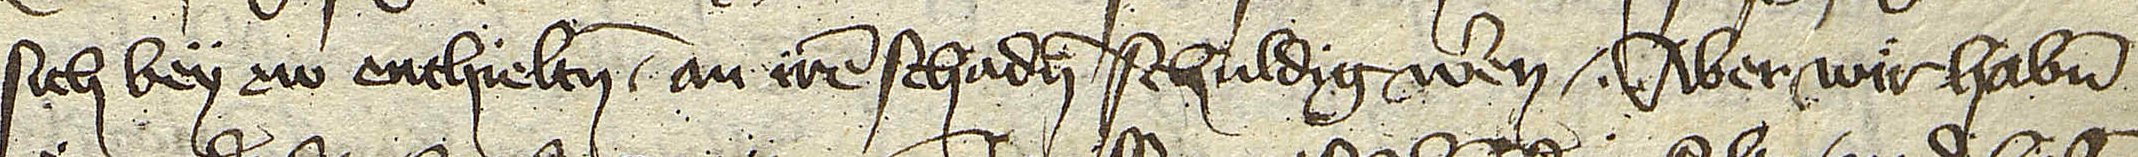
ſich bey ew enthieltn* / an ire* ſchadn* ſchuldig w*en / . Aber wir habn*
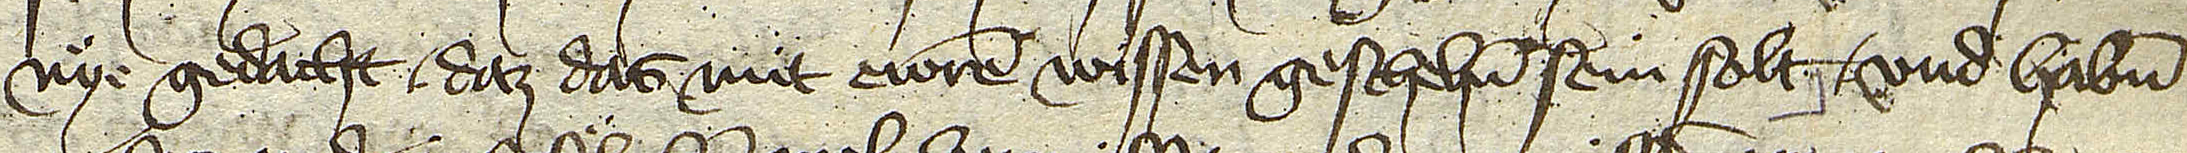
nye gedacht / daʒ das mit ewre* wiſſen geſchehn* ſein ſolt / vnd habn*
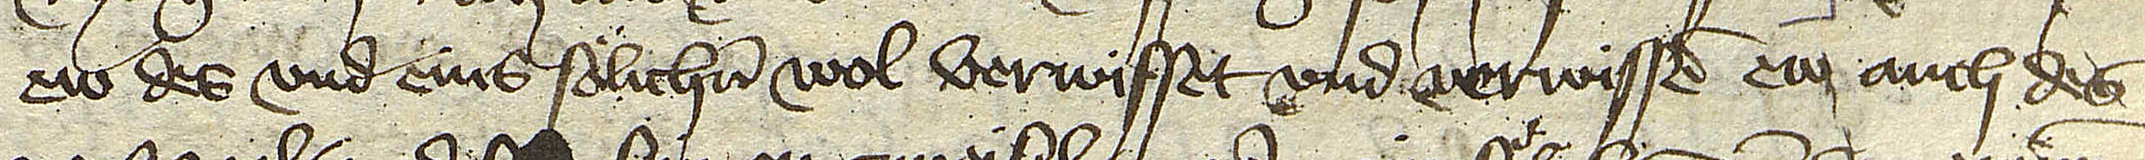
ew des eins ſölichn* wol verwiſſet vnd verwiſſe* ew auch des
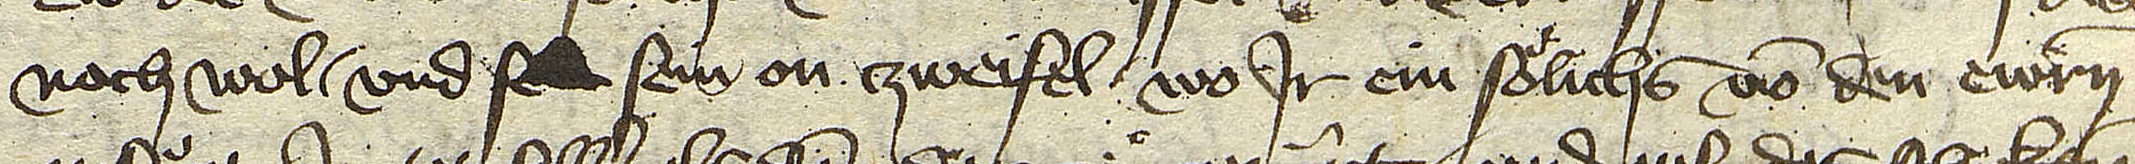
noch wol / vnd ſe ſein on cʒweifel / wo Ir ein ſölichs vo* den ewrn*
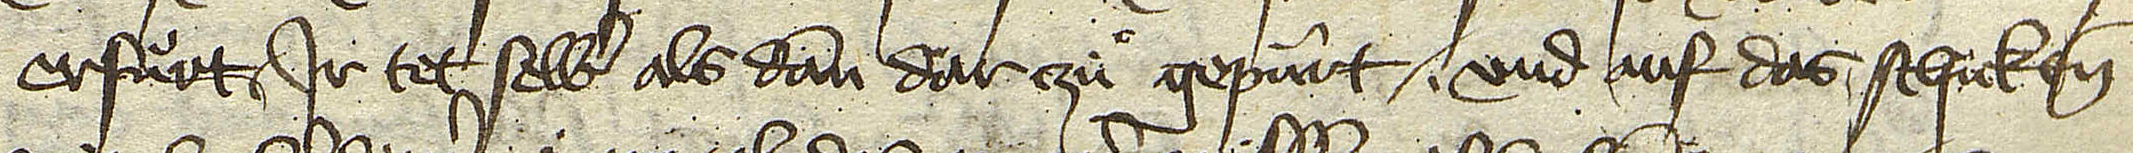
erfüret / Ir tet ſelb* als dan* dar cʒü gepürt / vnd auf das ſchicktn*
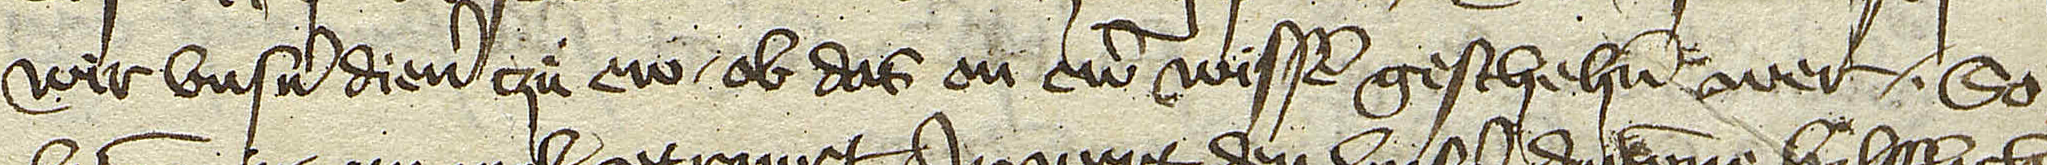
wir vnſn* dien* cʒü ew / ob das on ew* wiſſe* geſchehe* wer / . So
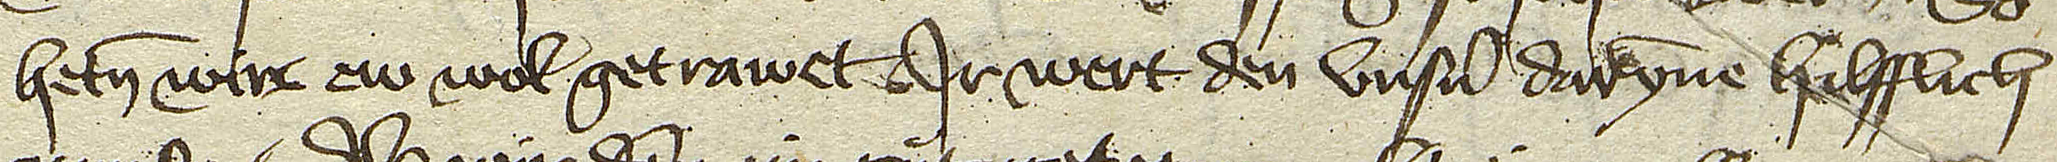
hetn* wir ew wol getrawet / Ir wert den vnſn* daryne* hilfflich
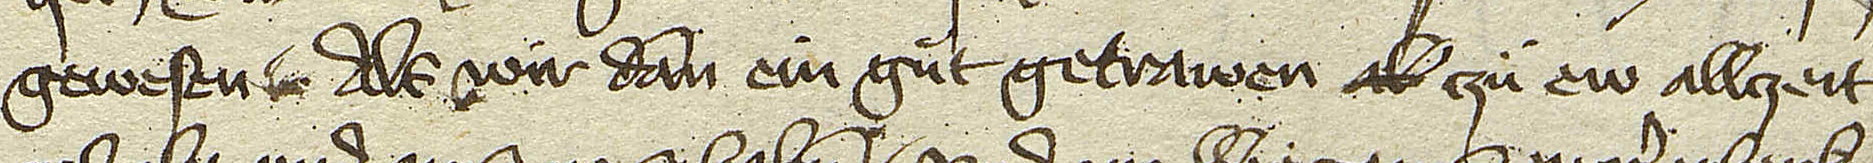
geweſen / Als wir dan* ein güt getrawen al cʒü ew allcʒeit
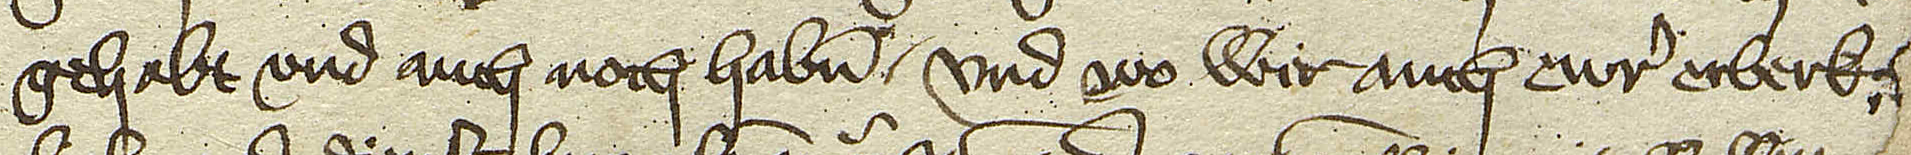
gehabt vnd auch noch habn* / vnd wo wir auch ewr* erberk*
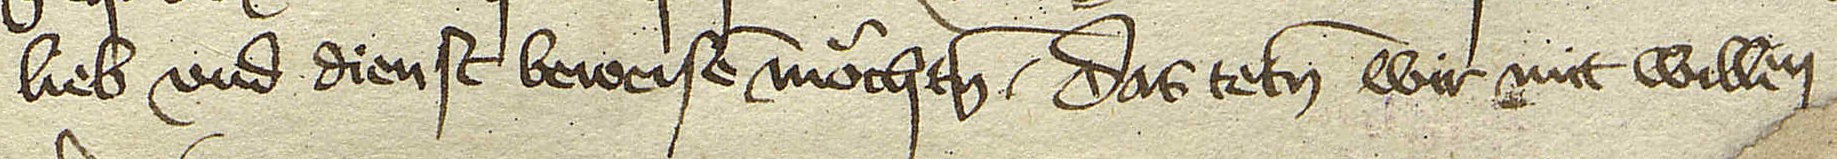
lieb vnd dienſt beweiſe* möchtn* / Das tetn* wir mit willen
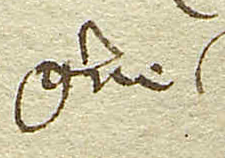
g*ne / .
